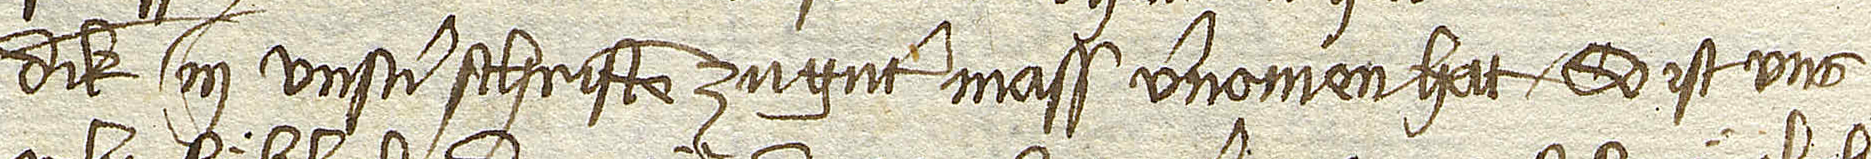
dik* in vnſ*n ſchrifte* ʒu gut* maſſ v*nomen hat / So iſt vns
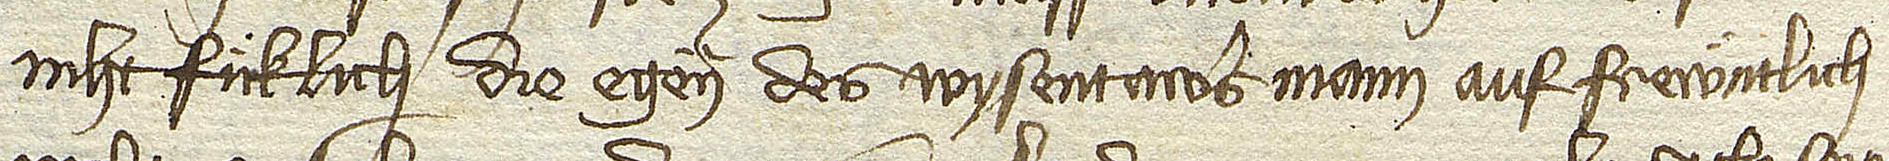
niht füklich die egen* des wyſentaw*s mann auf frewntlich
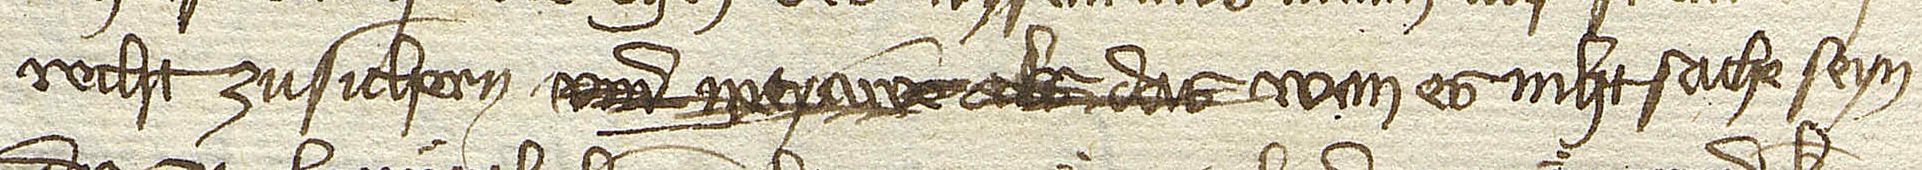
recht ʒu ſichern / vnd getrawe* als das wan es niht ſache ſeyn
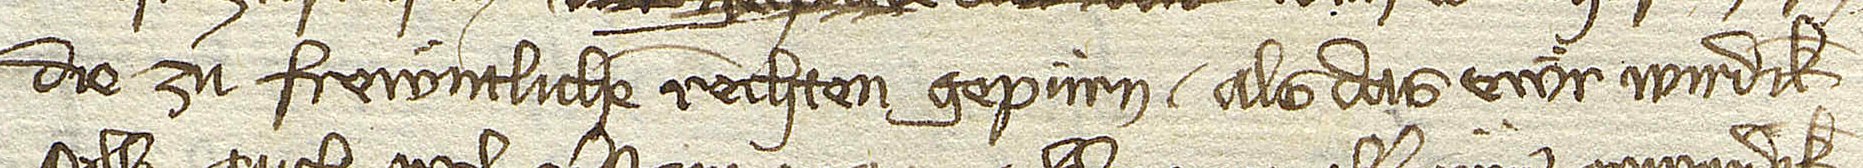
die ʒu frewntliche* rechten gepürn / als das ewr wirdik*
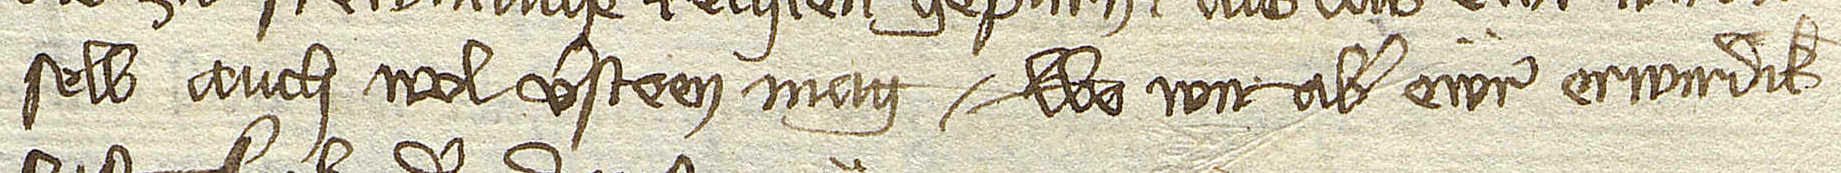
ſelb auch wol v*ſteen mag / Wo wir ab* ew*r erwirdik*
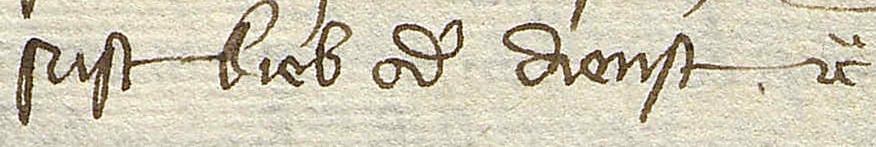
ſuſt lieb od* dienſt . ec*
